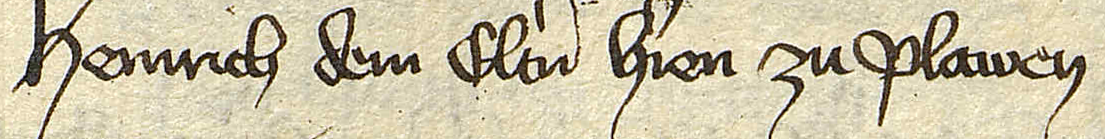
heinrich dem Eltn* hr*en cʒu Plawen
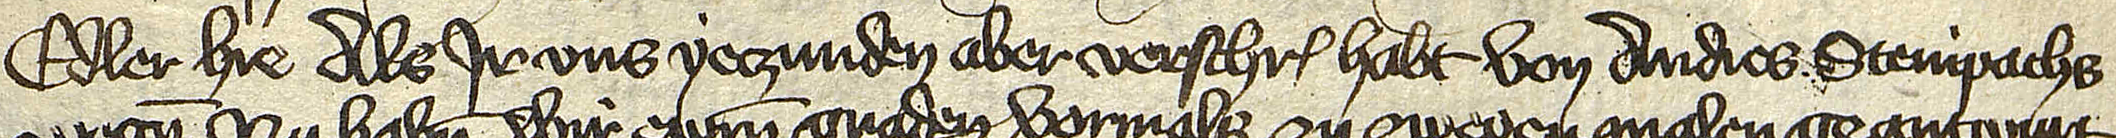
Edler h*re Als Ir vns yecʒunden aber verſchr* habt von Andres Steinpachs
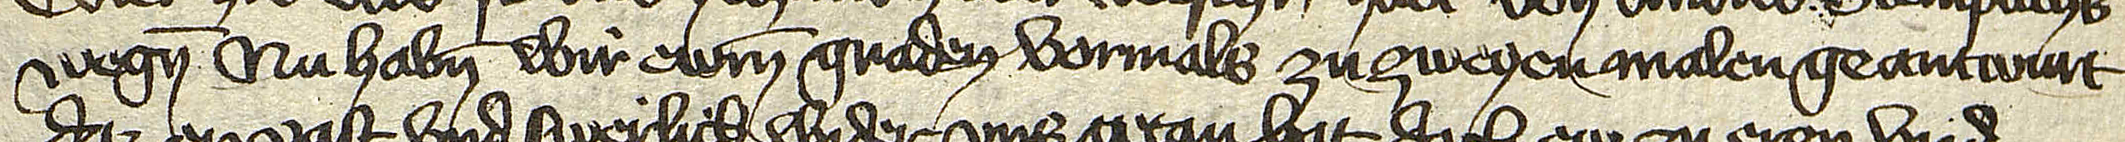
wegn* Nu habn* wir ewrn* gnaden vormals cʒu cʒweyen malen geantwurt
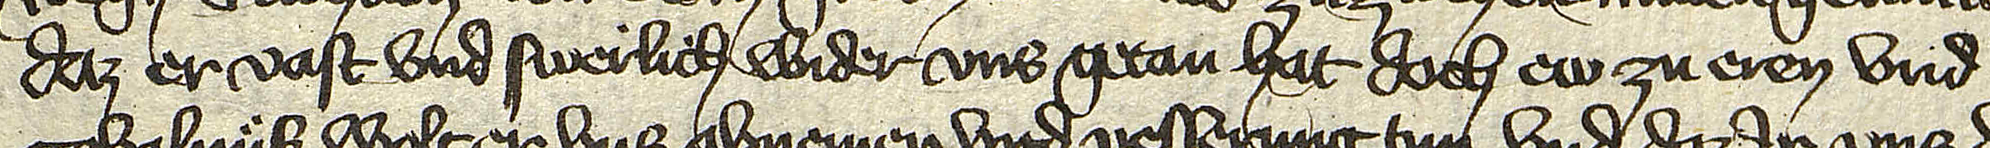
daʒ er vaſt vnd ſwerlich wider vns getan hat doch ew cʒu eren vnd
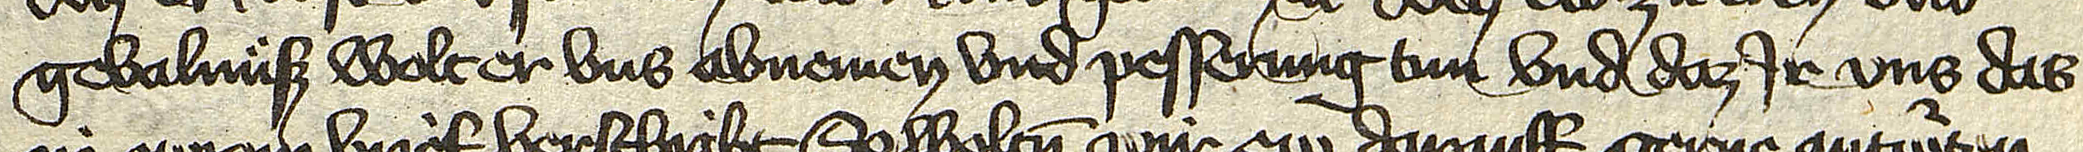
gevalnüſʒ wolt er vns abnemen vnd peſſerunf tun vnd daʒ Ir vns das
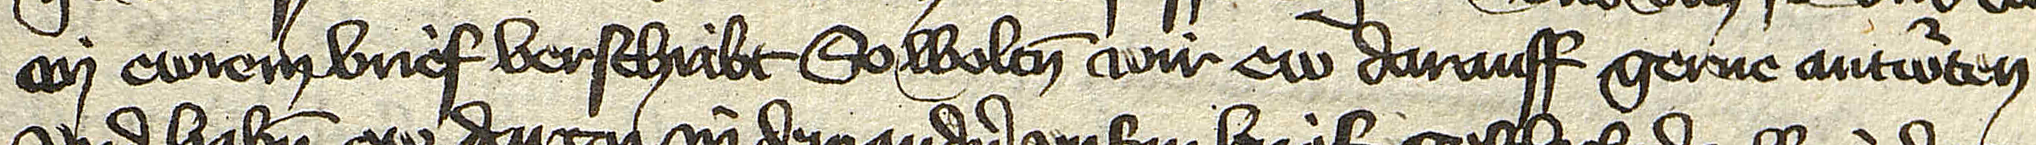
an ewrem brief verſchribt So woltn* wir ew darauff gerne antw*ten
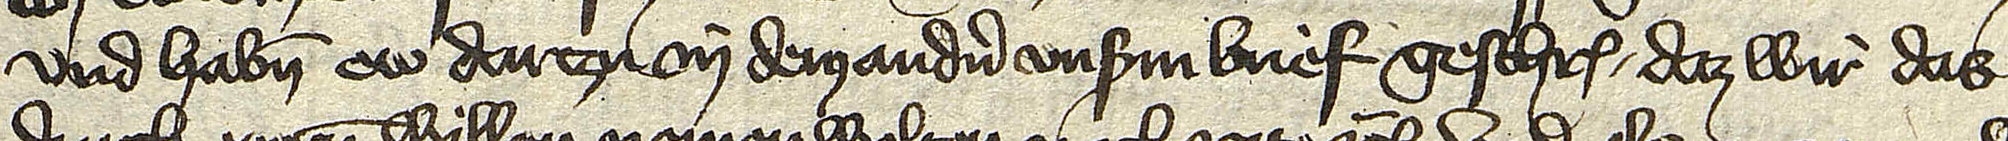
vnd habn* ew arcʒu in den andn* vnſ*m brief geſchr* / daʒ wir das
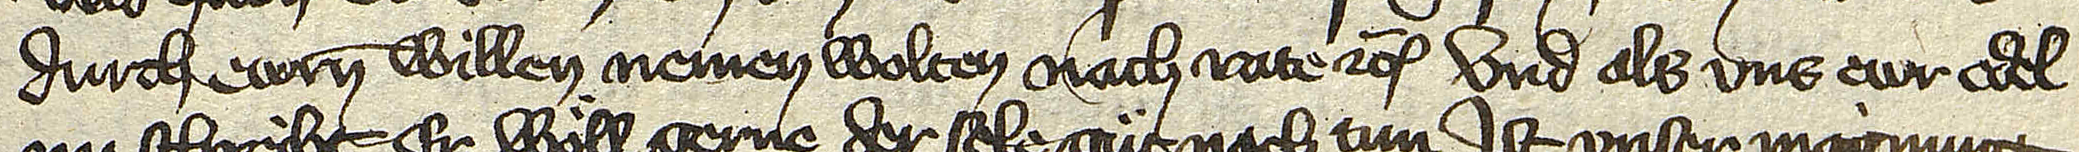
durch ewrn* willen nemen wolten nach rate ec* vnd als vns ewr edel
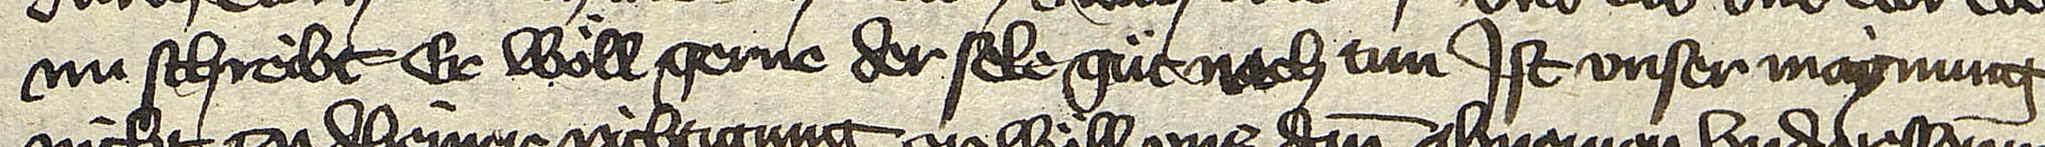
nu ſchreibt Er wöll gerne der ſele güt nach tun Iſt vnſer maynung
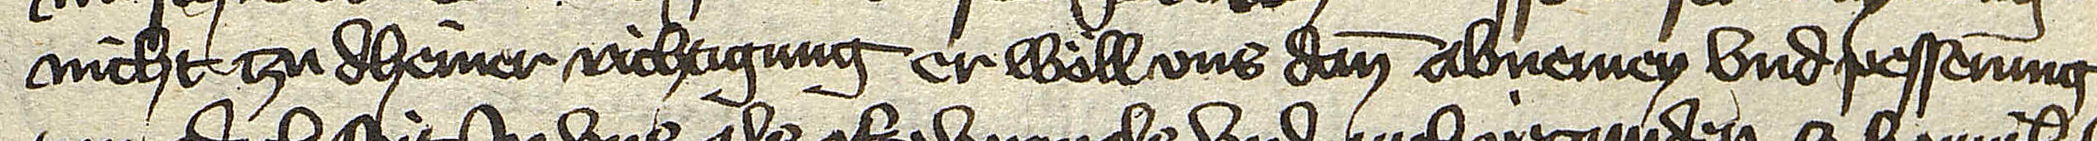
nicht cʒu dheiner richtigung er wöll vns dan* abnemen vnd peſſerung
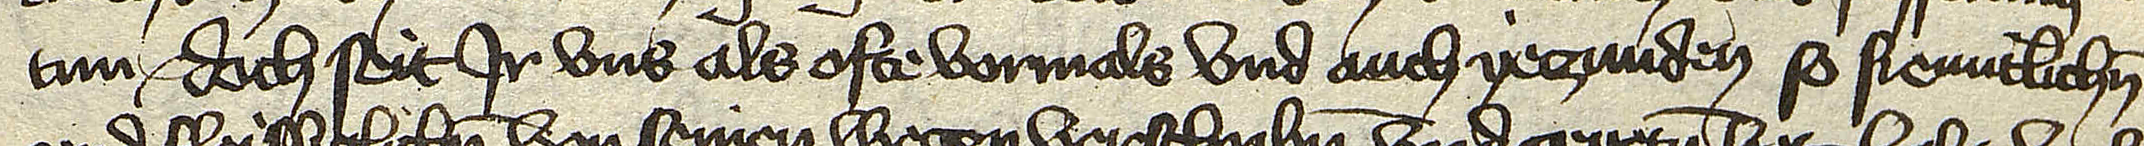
tun / doch ſeit Ir vns als ofte vormals vnd auch yecʒunden ſo freuntlichn*
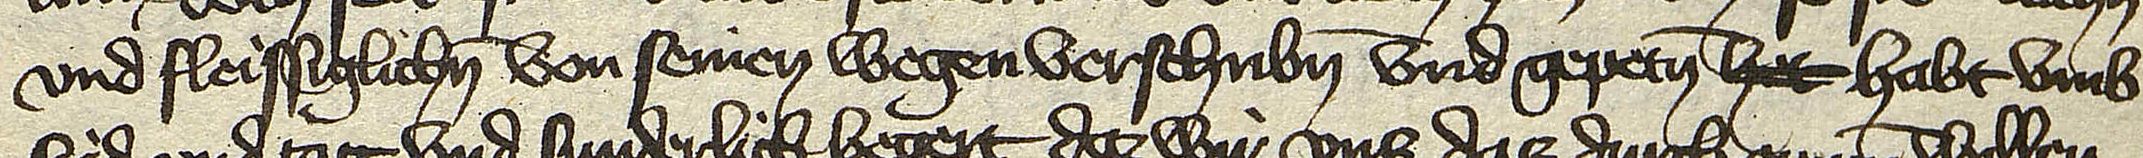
vnd fleiſſiglichn* von ſeinen wegen verſchribn* vnd gepetn* hat habt vmb
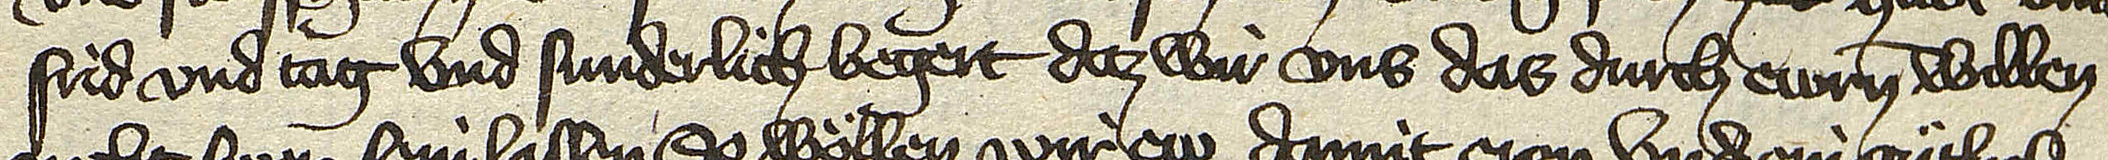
frid vnd tag vnd ſunderlich begert daʒ wir vns das durch ewrn* willen
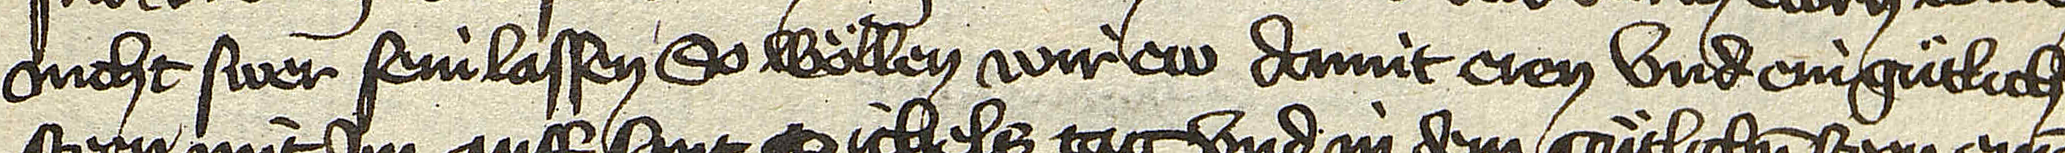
nicht ſwer ſein laſſen So wöllen wir ew damit eren vnd ein gütlich
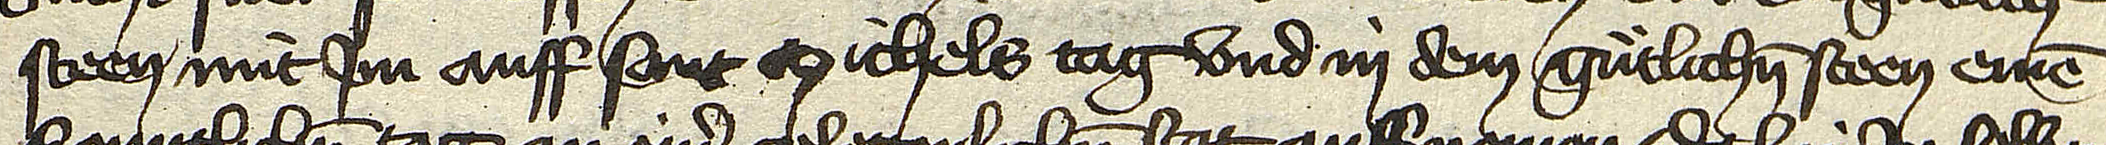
ſteen mit Im auff ſant Michels tag vnd in dem gütlich ſteen eine*
